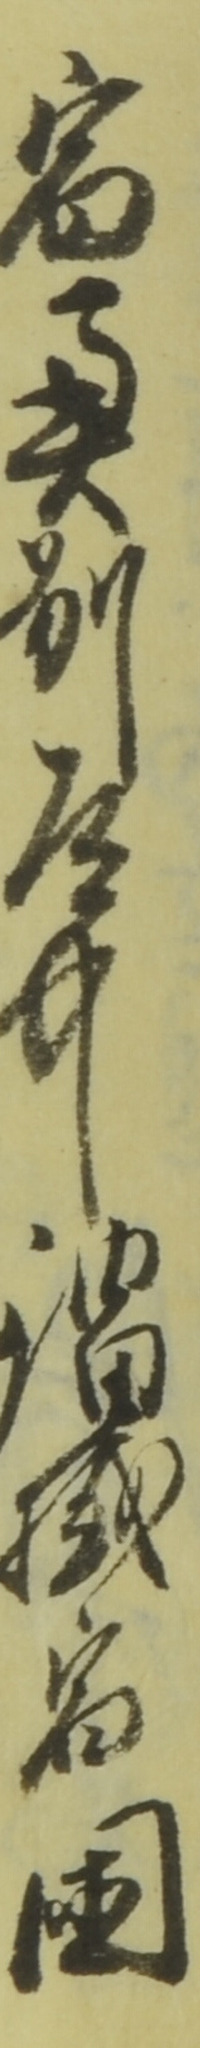宿奥州道中鍋掛宿困

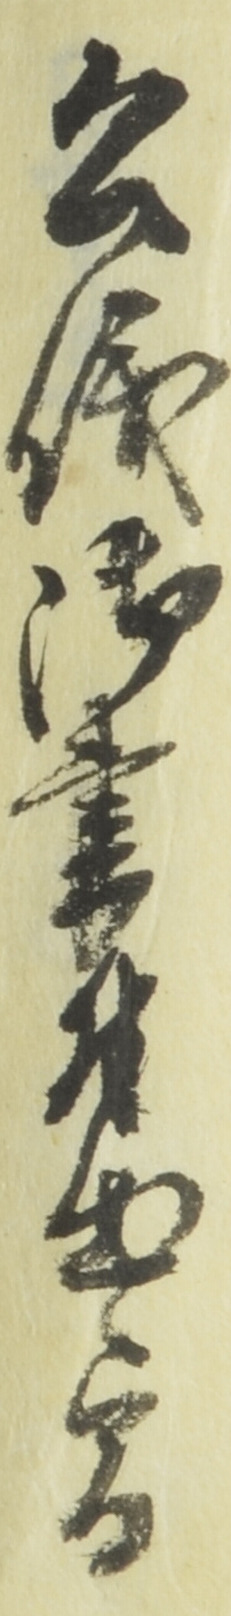公儀御書付出候間
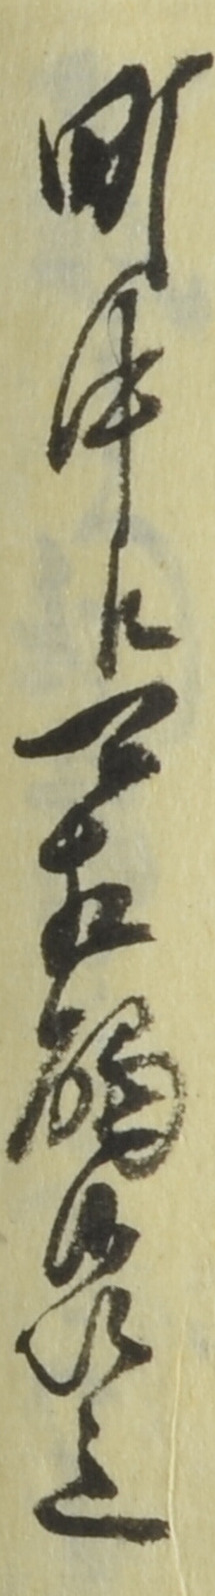町中江可相触候以上
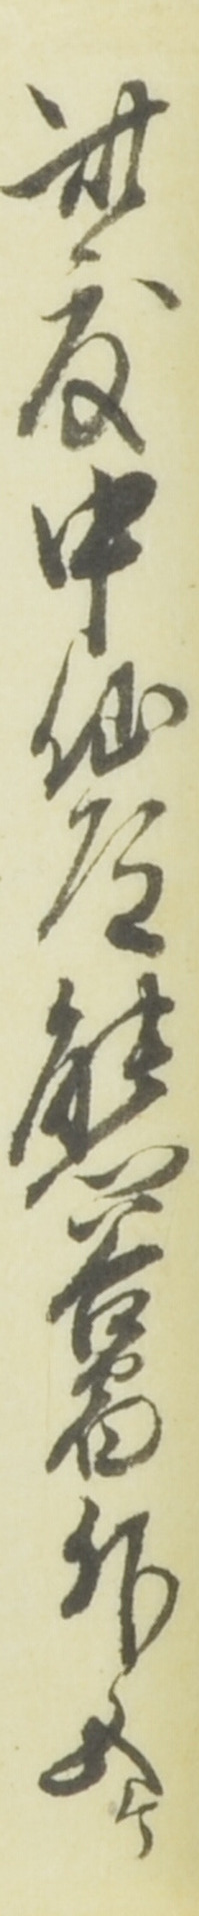此度中仙道熊谷宿外五ヶ
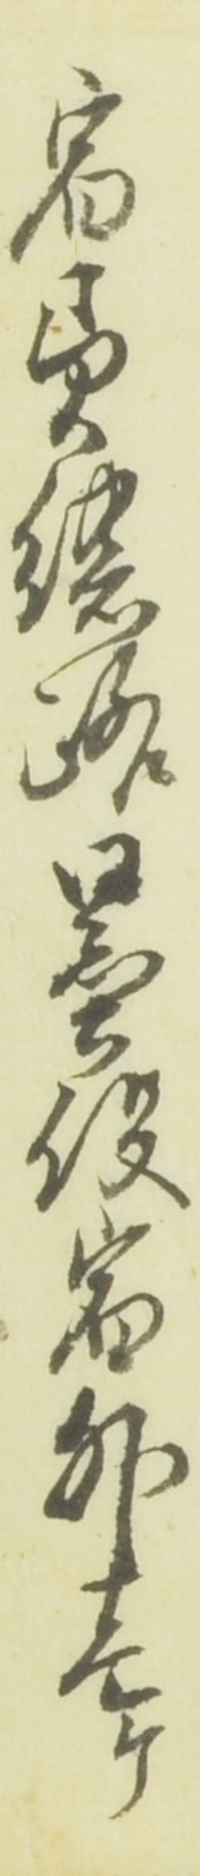宿美濃路ニ墨役宿外壱ヶ
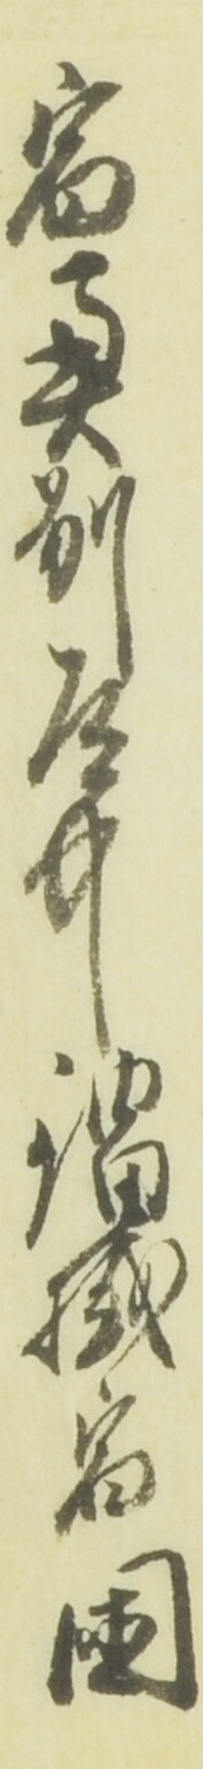宿奥州道中鍋掛宿困
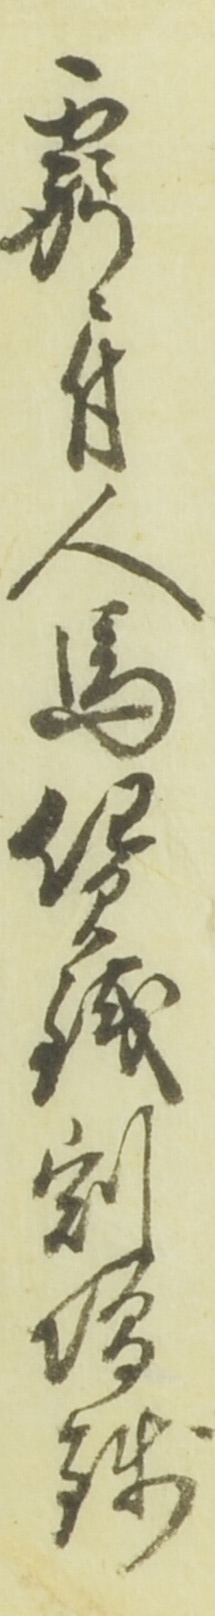窮ニ付人馬賃銭割増銭
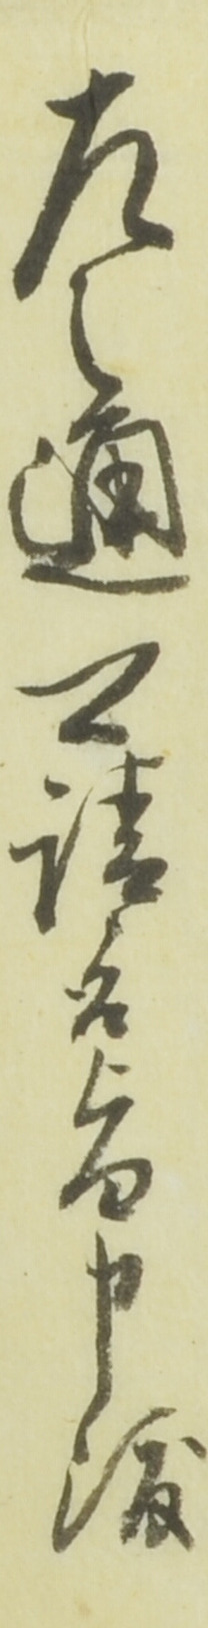左之通可請取旨申渡
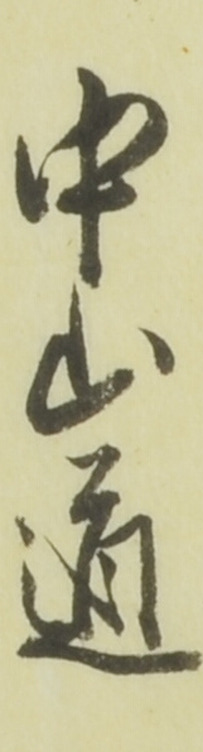中山道
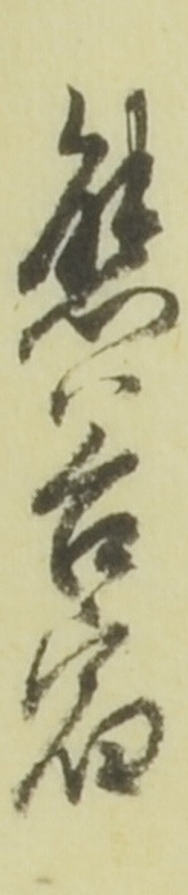熊谷宿
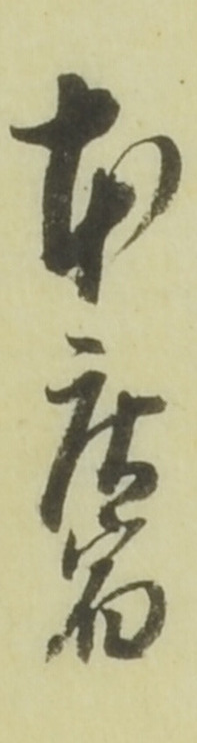本庄宿
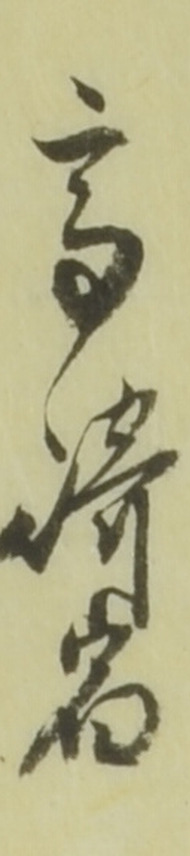高崎宿
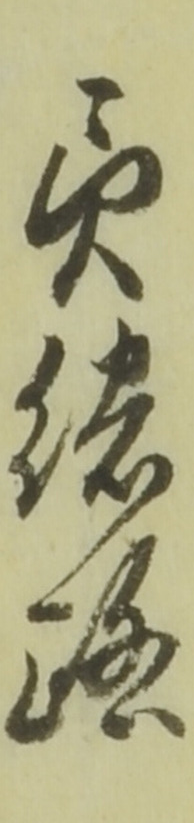美濃路
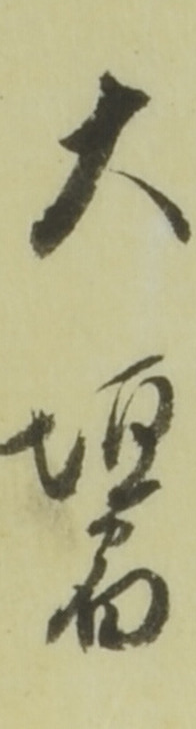大垣宿
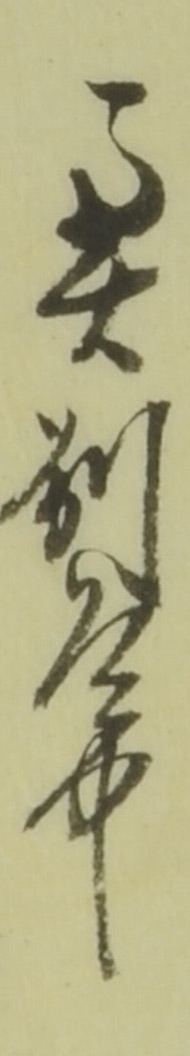奥州道中
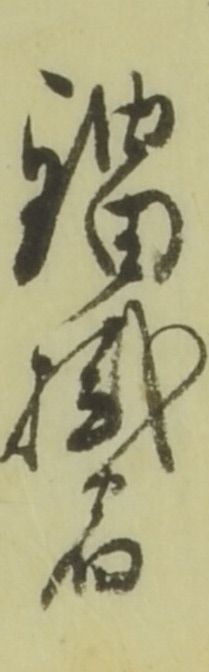鍋掛宿
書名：御触書御書附控
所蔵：伊那市立高遠町図書館・合同会社AMANE
